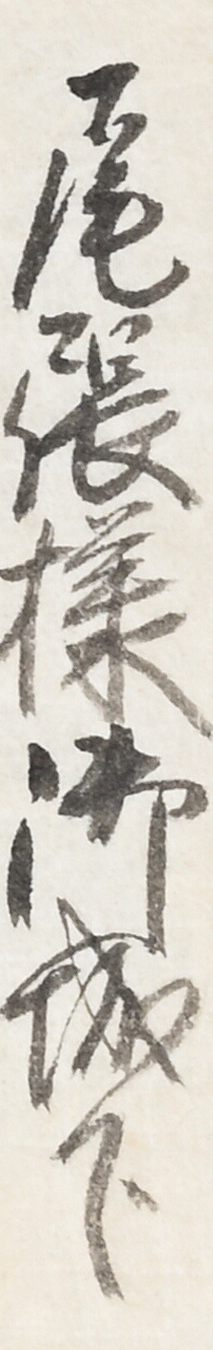尾張様御城下
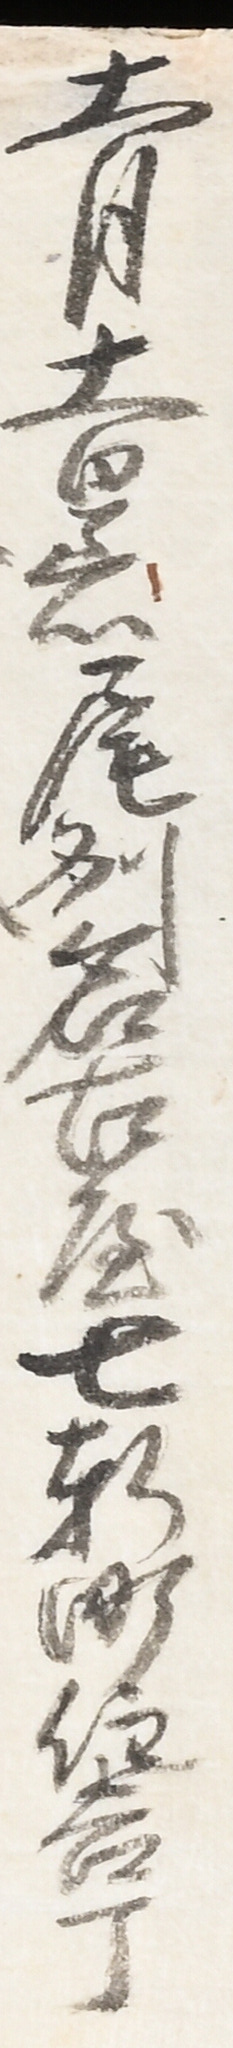十一月十一日着尾州名古屋七軒町住吉丁
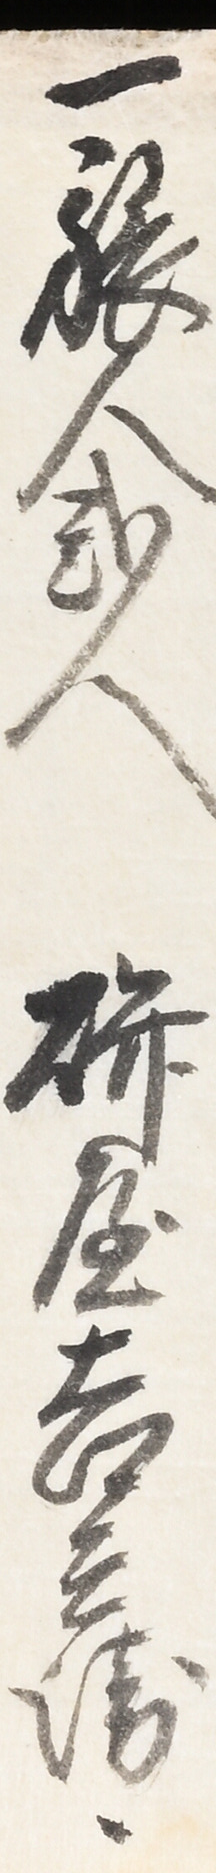一旅人弐人研屋吉兵衛・
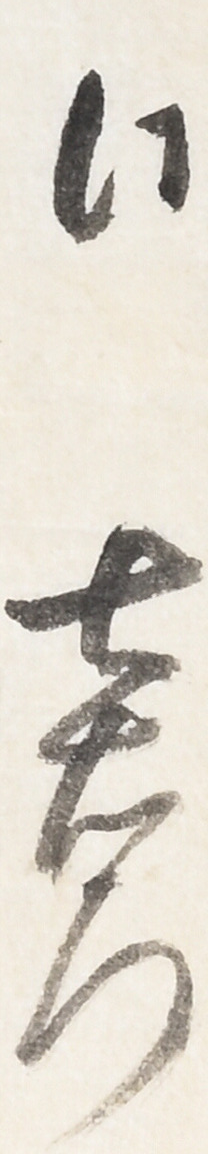同七右衛門
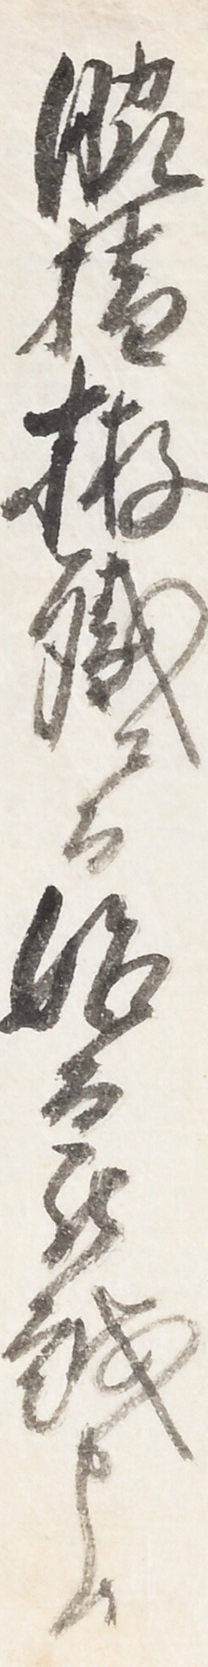脇指拵職ニ而始而罷越申候
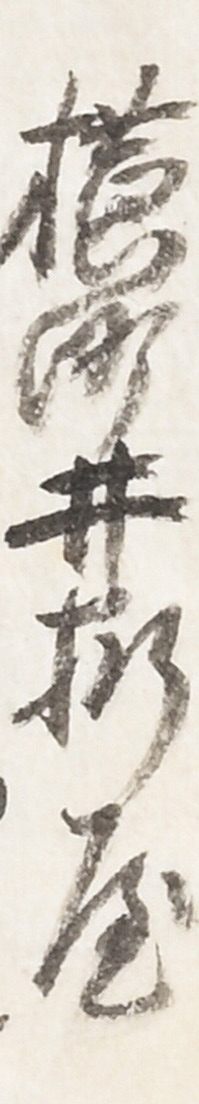横町井桁屋
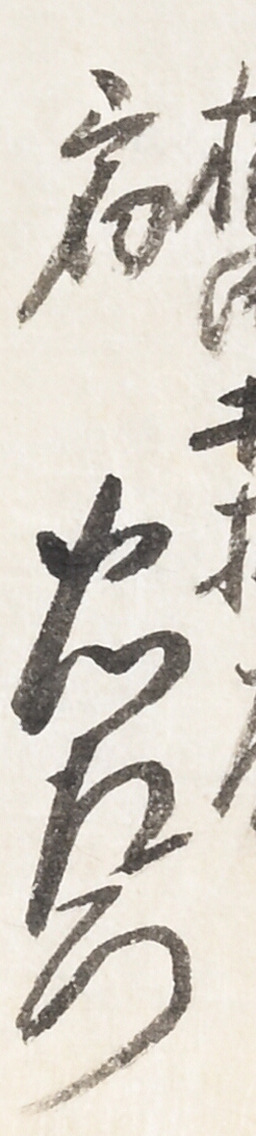宿忠左衛門
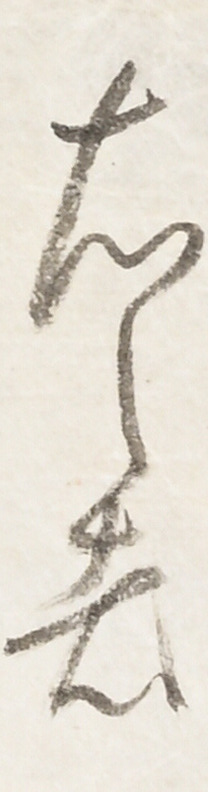右之者
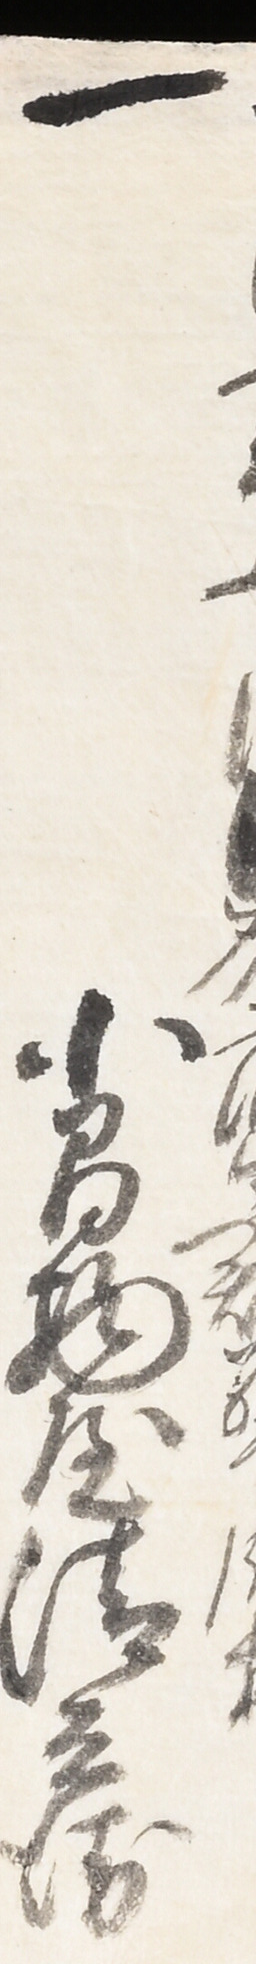一小間物屋清兵衛・
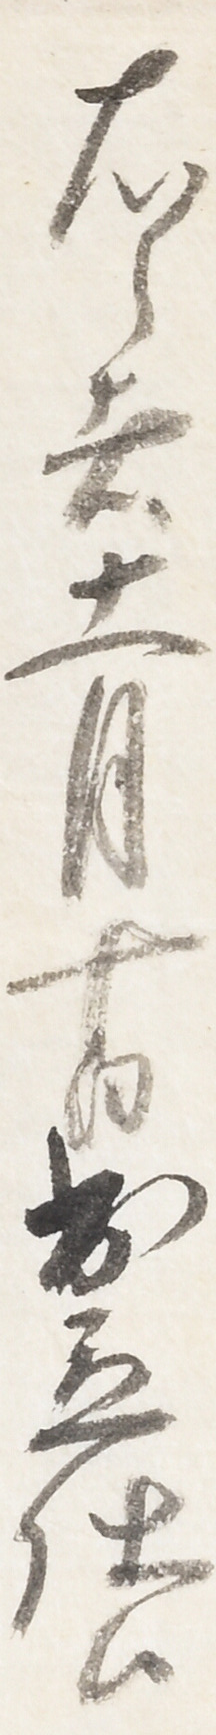右之者十一月十日出立仕候
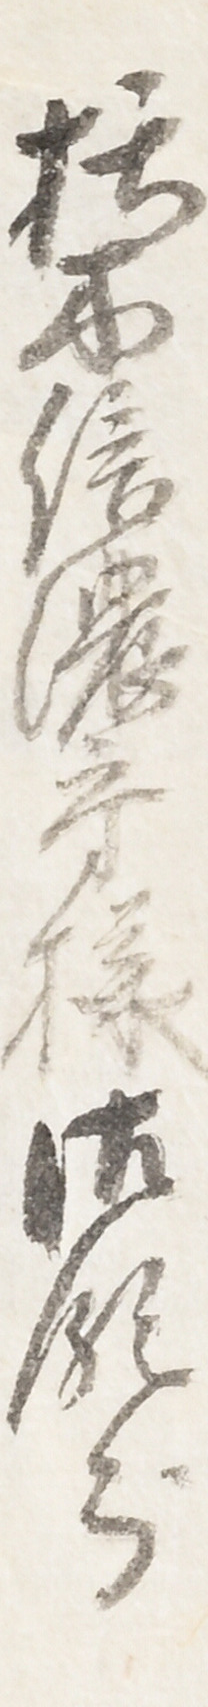朽木信濃守様御領分
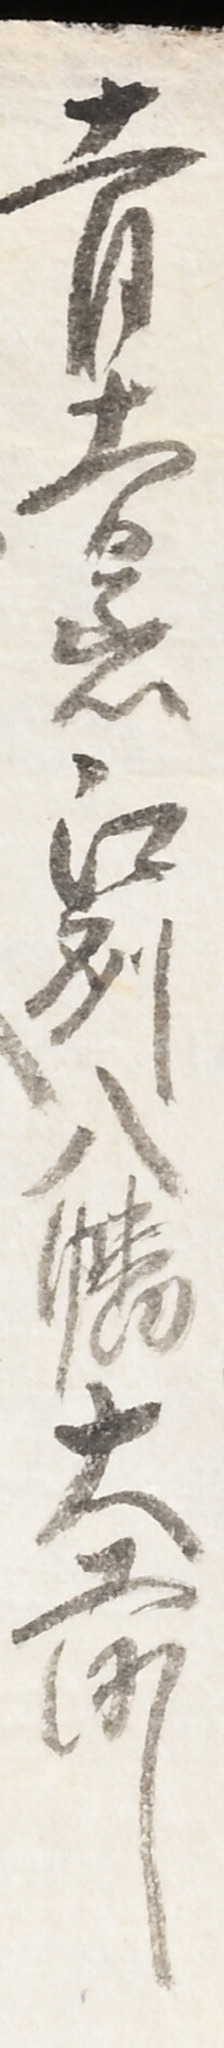十一月十一日着江州八幡大工町
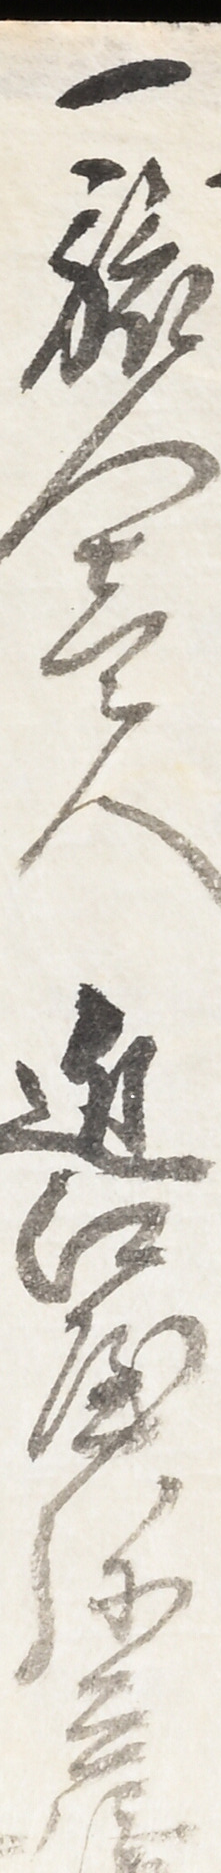一旅人壱人近江屋弥兵衛・
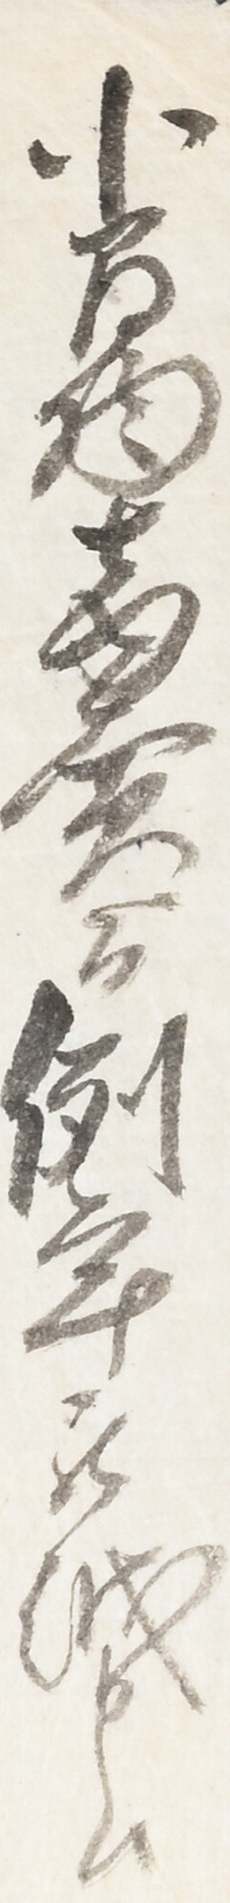小間物商売ニ而例年罷越申候
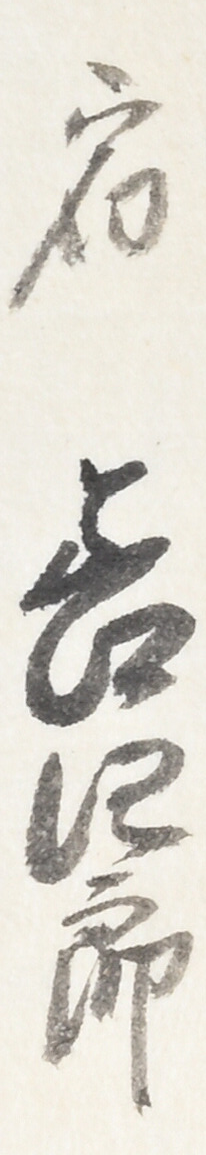宿善四郎
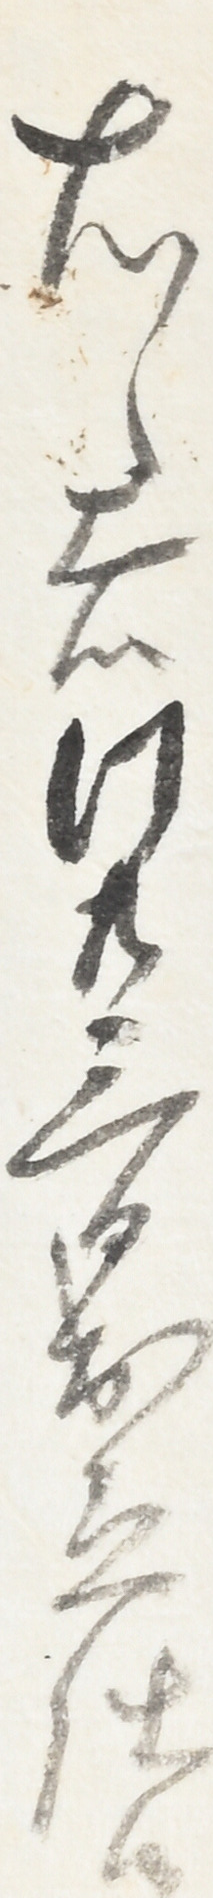右之者同廿三日出立仕候
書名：旅人泊控帳
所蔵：伊那市立高遠町図書館・合同会社AMANE
